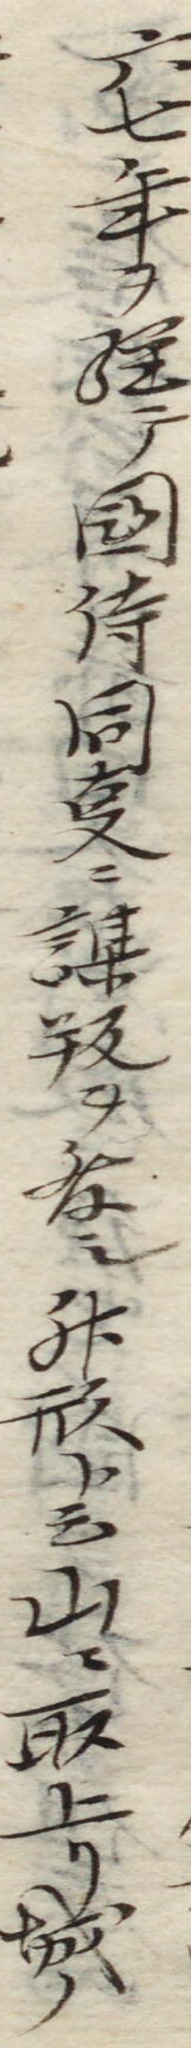六七年ヲ住テ国侍同事ニ謀叛ヲシ升形ト云山ニ取上リ城ノ
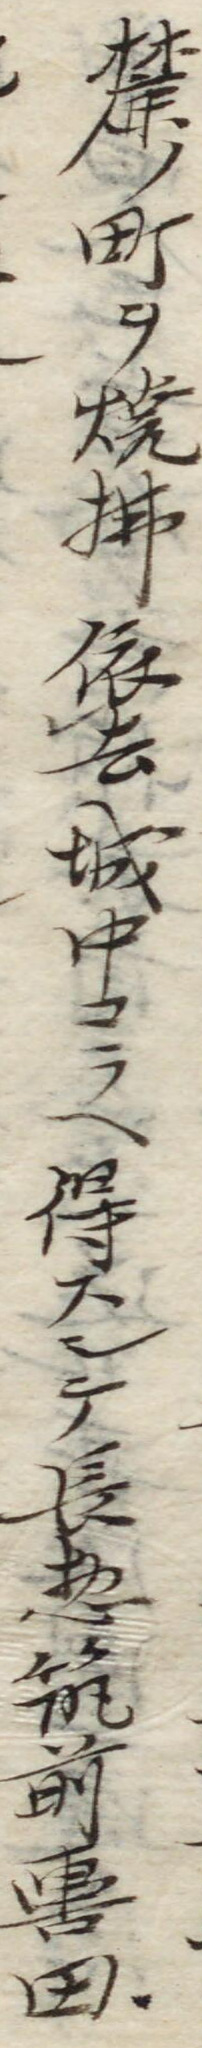麓ノ町ヲ焼払依去城中コラヘ得スシテ長惣筑前響田
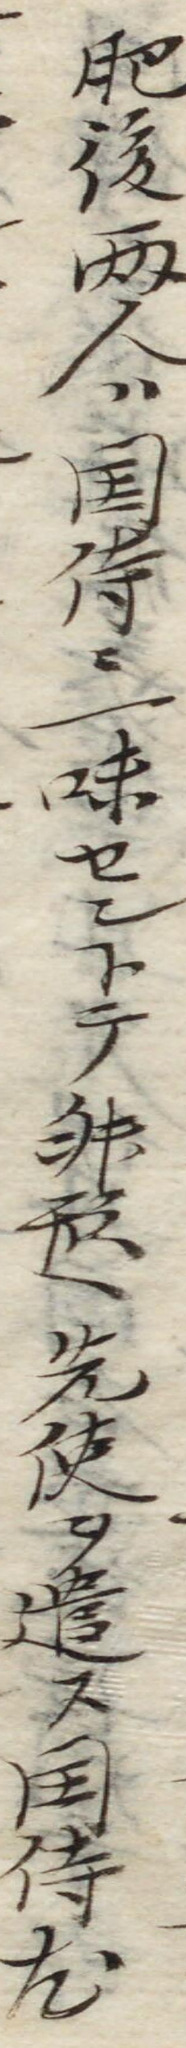肥後両人ハ国侍ニ一味セントテ升形ヘ先使ヲ遣ス国侍尤
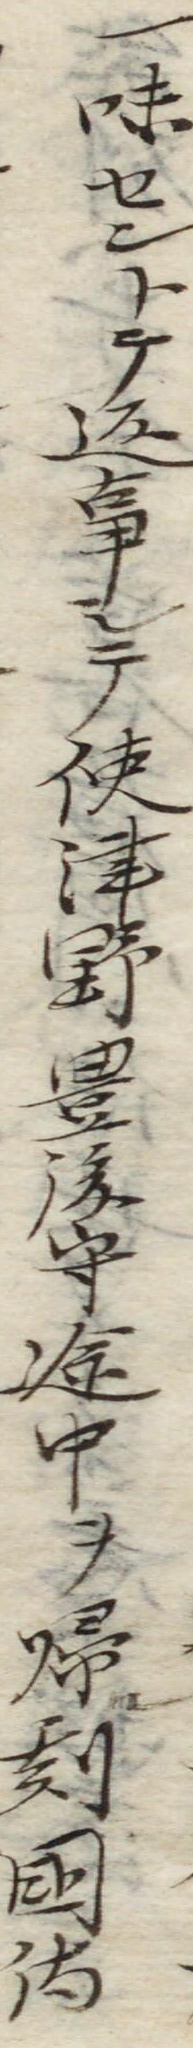一味セントテ返事シテ使津野豊後守途中ヲ帰ル刻国侍
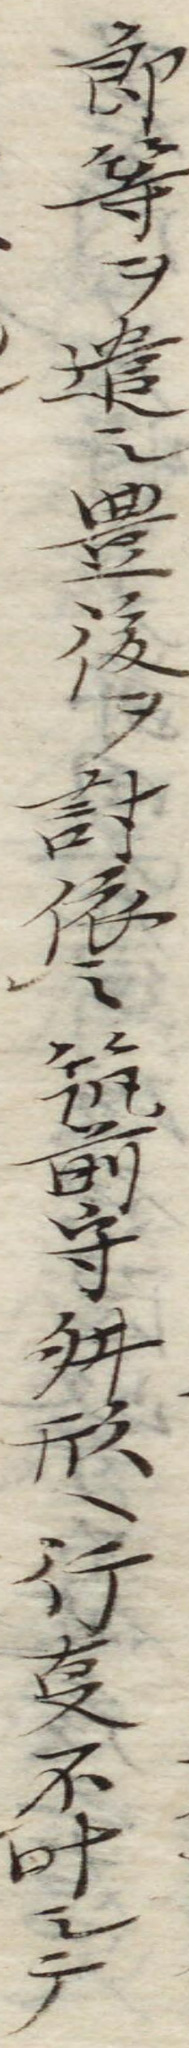郎等ヲ遣シ豊後ヲ討依之筑前守舛形へ行事不叶シテ
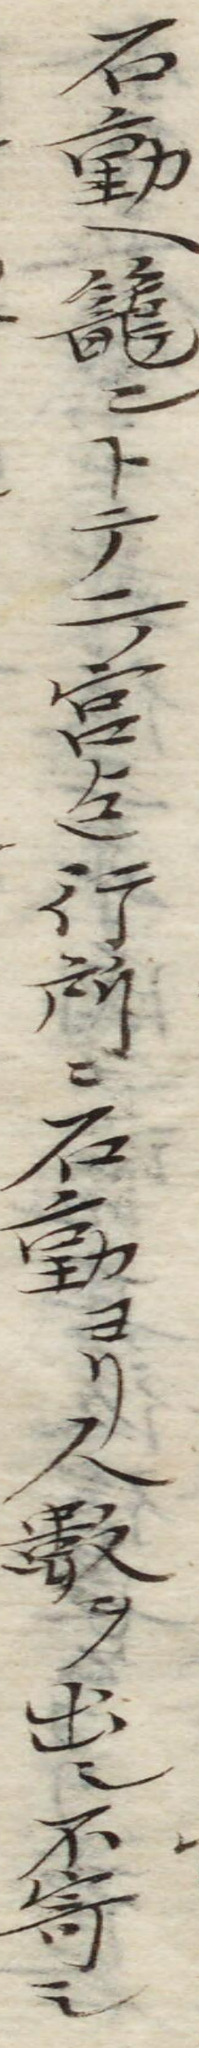石動ヘ籠ントテ二ノ宮迄行所ニ石動ヨリ人数ヲ出シ不寄シ
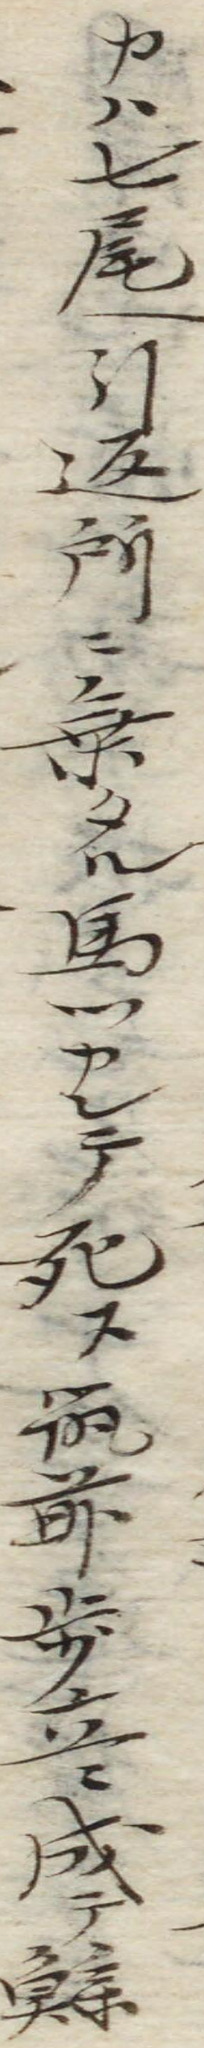カハ七尾ヘ引返所ニ乗タル馬ツカレテ死ス筑前歩立二成テ鰺
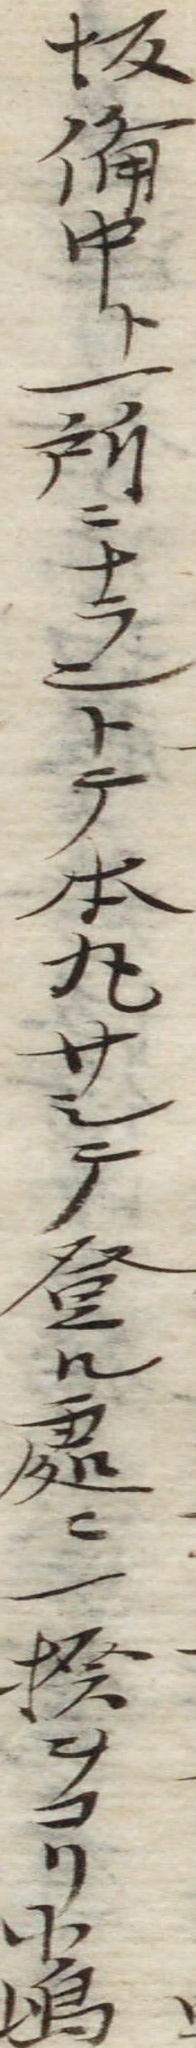坂備中ト一所ニナラントテ本丸サシテ登ル處ニ一揆ヲコリ小嶋
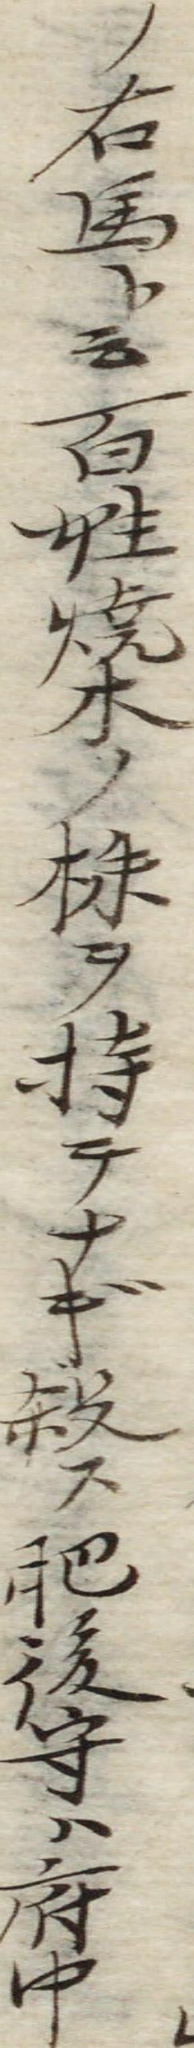ノ右馬ト云百姓焼木ノ株ヲ持テナギ殺ス肥後守ハ府中
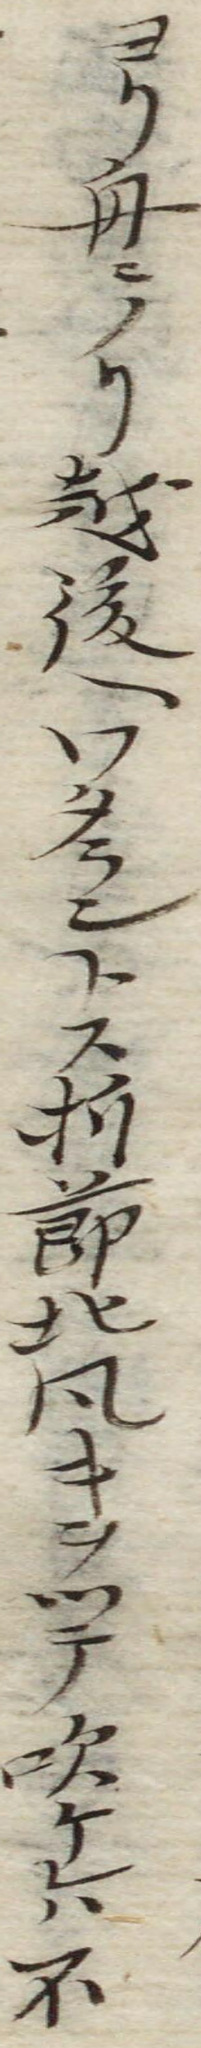ヨリ舟ニノリ越後ヘワタラントス折節北風キヲツテ吹ケレハ不
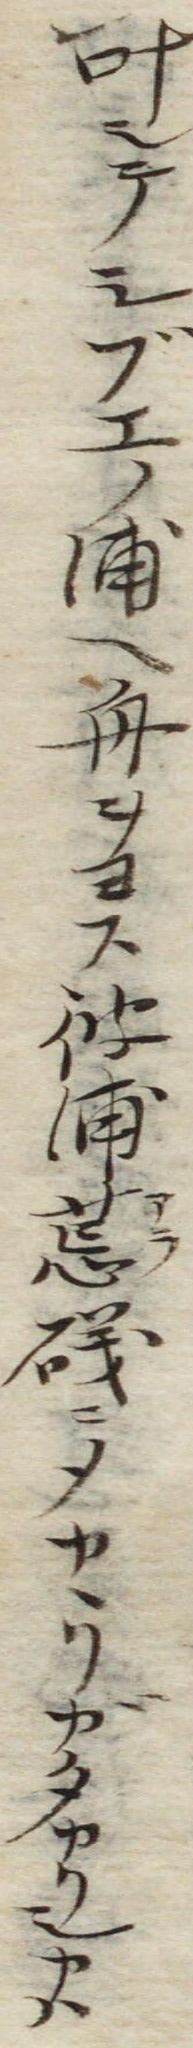叶シテシブエノ浦へ舟ヲヨス彼浦荒磯ニメカ丶リガタカリシカハ

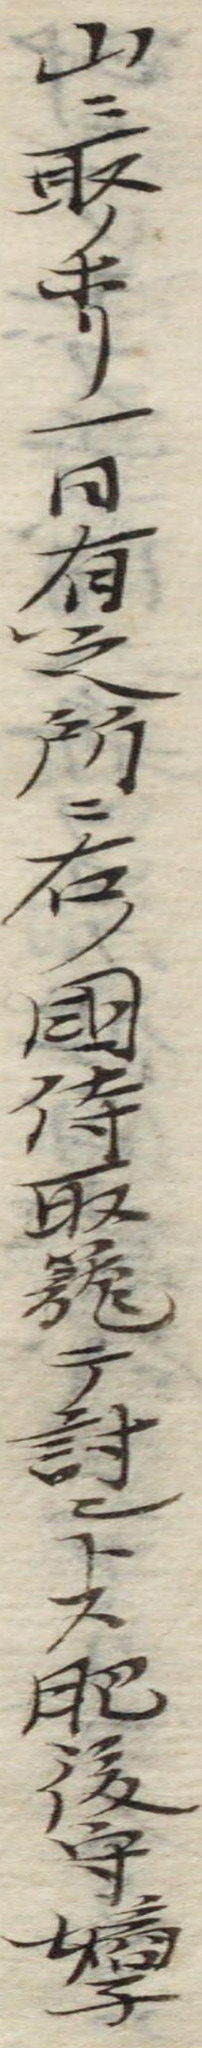山ニ取ノホリ一日有之所ニ右ノ国侍取籠テ討ントス肥後守嫡子
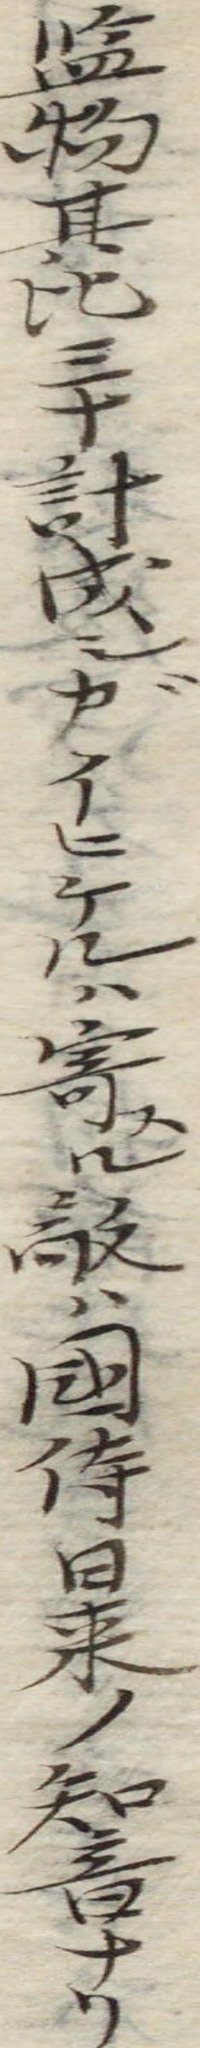監物其比三十計成シガイヒケルハ寄スル敵ハ国侍日来ノ知音ナリ
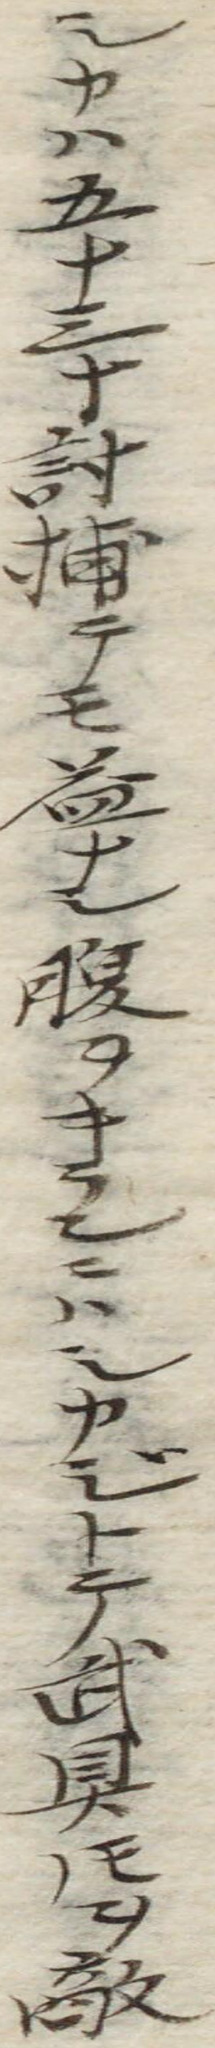シカハ五十三十討捕テモ益ナシ腹ヲキランニハシカジトテ武具トモヲ敵
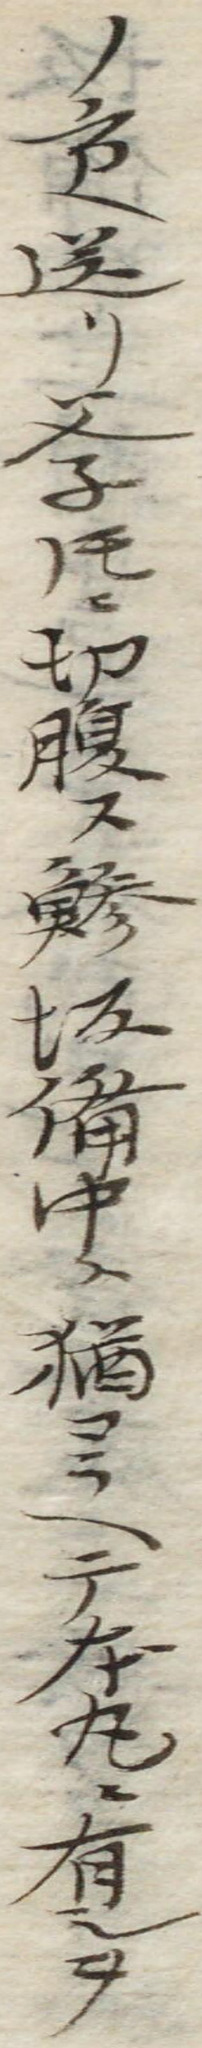ノ方ヘ送リ父子トモニ切腹ス鰺坂備中ハ猶コラヘテ本丸ニ有シヲ
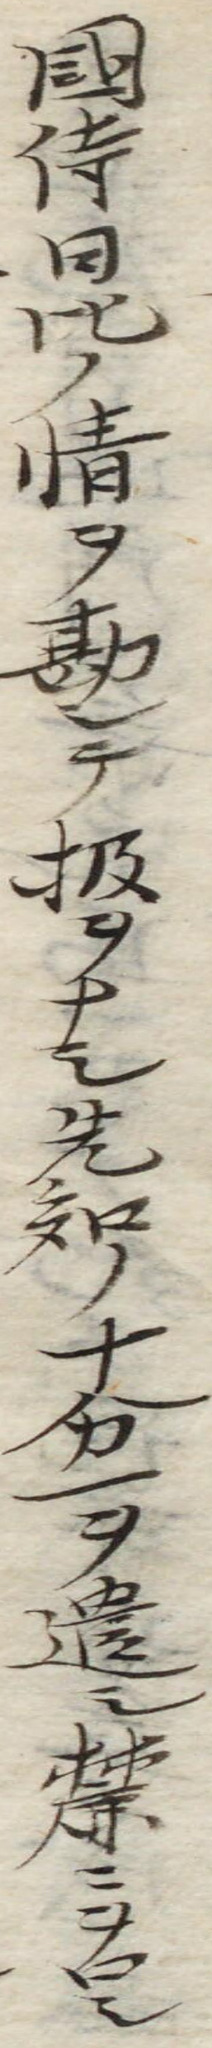国侍日比ノ情ヲ勘シテ扱ヲナシ先知ノ十分一ヲ遣シ麓ニヲロシ
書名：聞見雑録
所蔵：Ishikawa Prefectural Library
